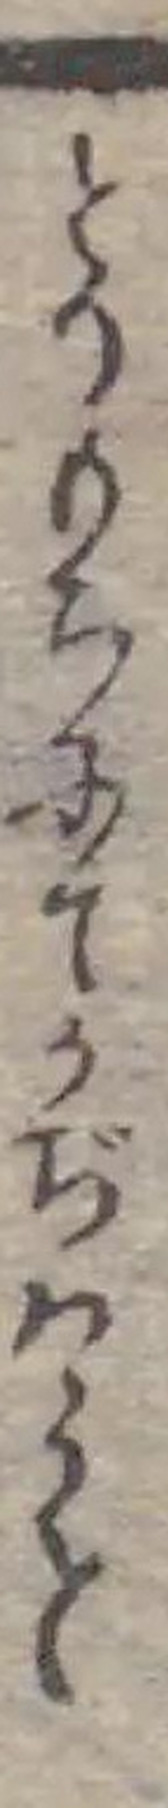とりもちにてかぢはらと
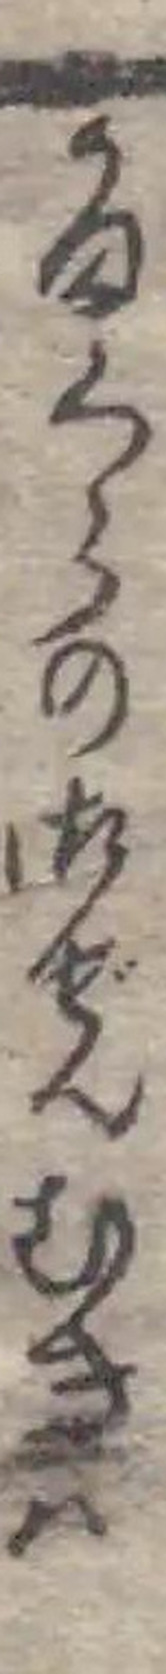かまくらの御ぜんむきは
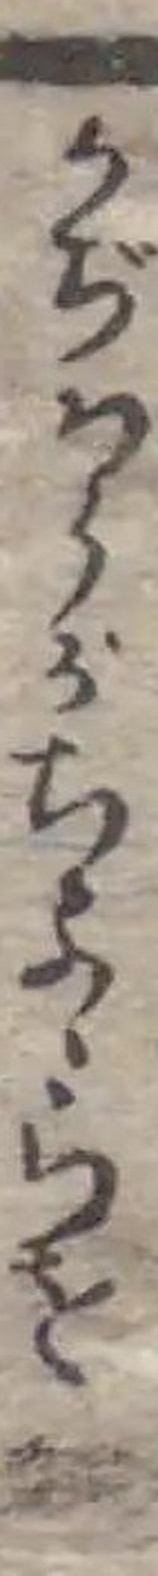かぢはらがちよゝらを
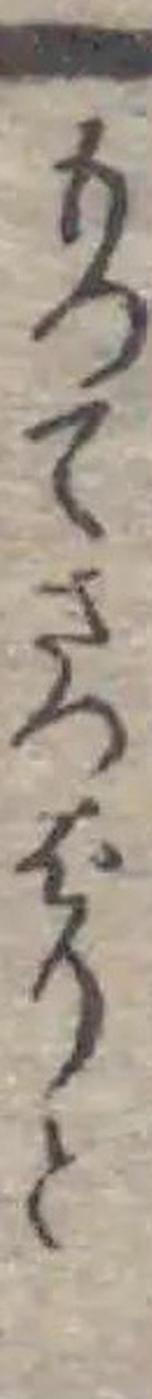もつてさつぱりと
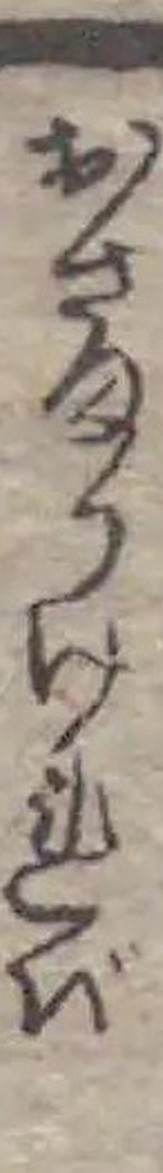おさまりければ
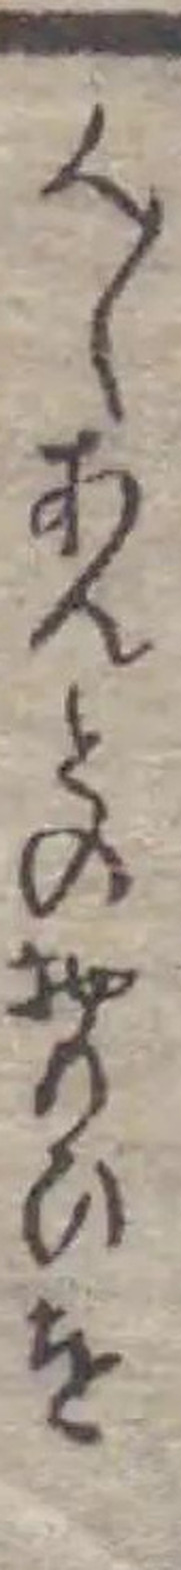人〳〵あんとのおもひを
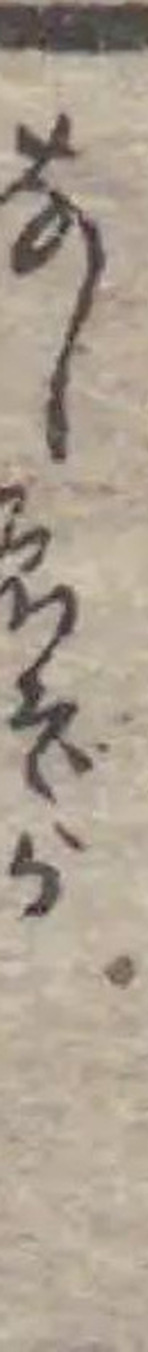なしゑぞが
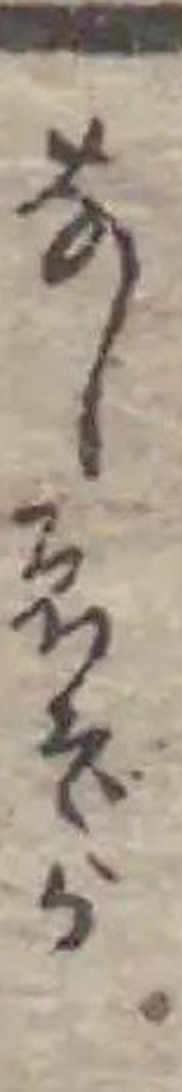なしゑぞが
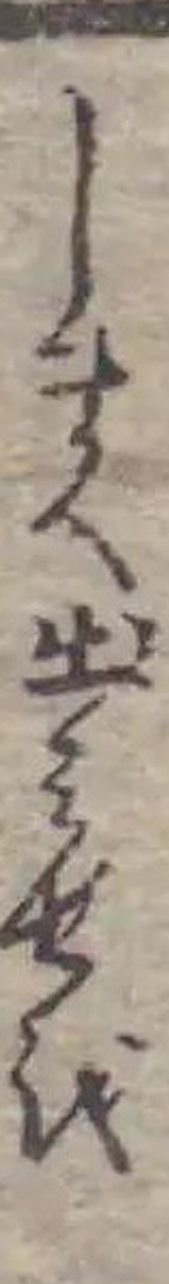しまへ出みせを
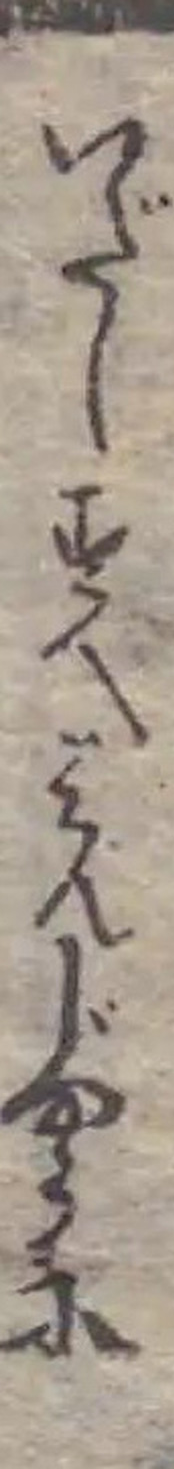いだしすへはんじやうに
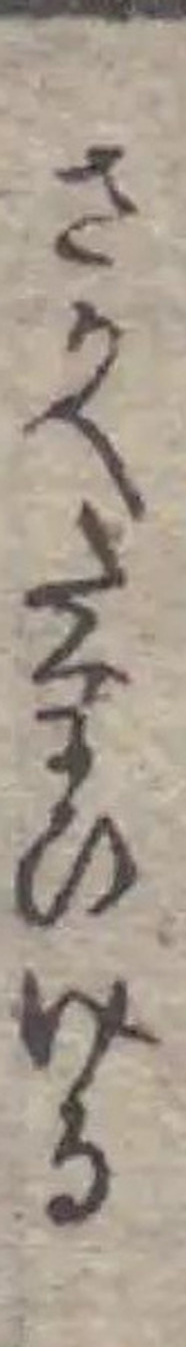さかへたまひける
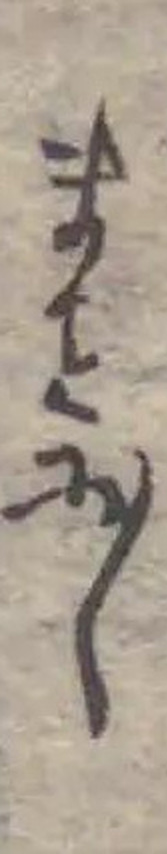まことに〳〵
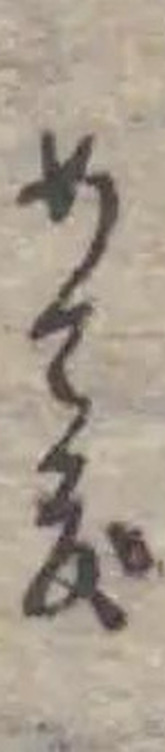めて度
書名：通増安宅関 2巻
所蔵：国立国会図書館 National Diet Library, JAPAN
